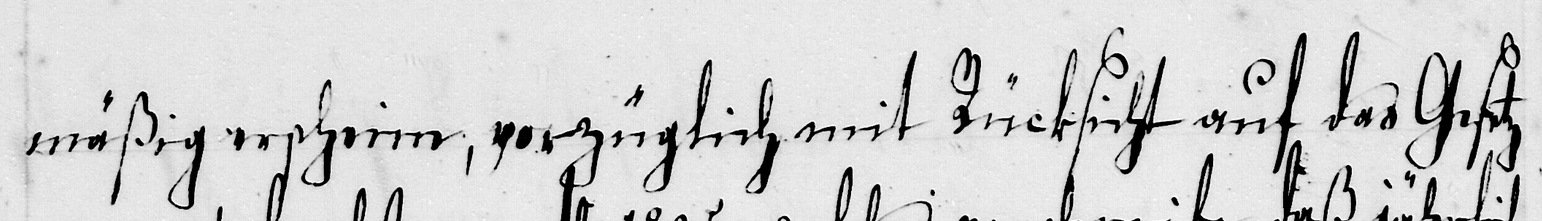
mäßig erscheine, vorzüglich mit Rücksicht auf das Gesetz
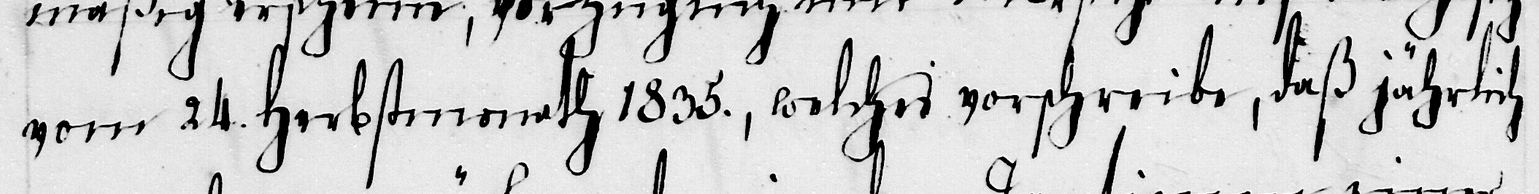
vom 24. Herbstmonath 1835., welches vorschreibe, daß jährlich
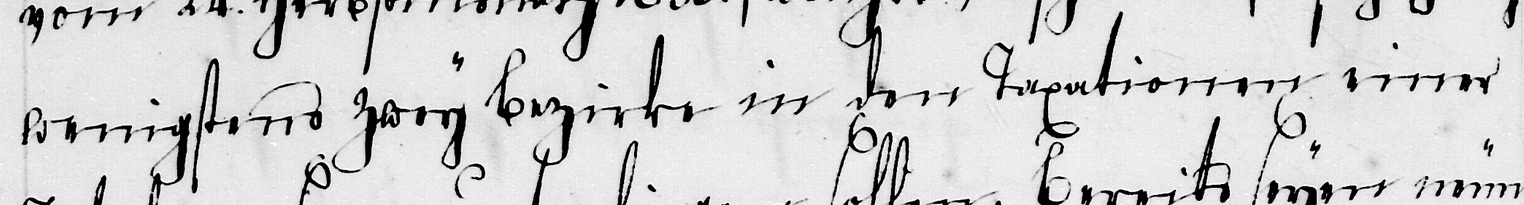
wenigstens zwey Bezirke in den Taxationen einer
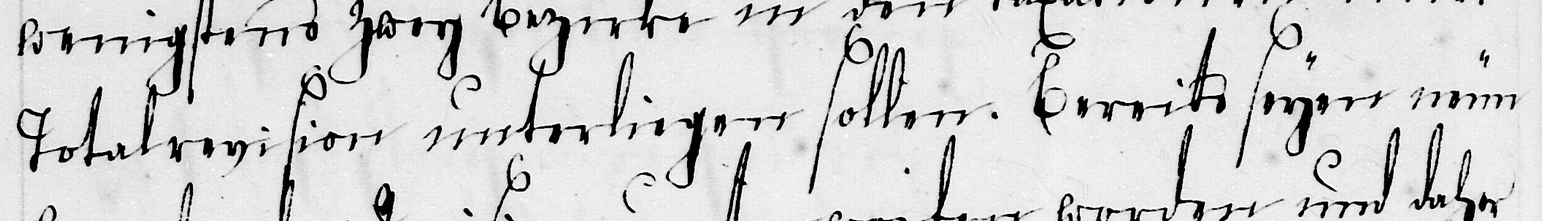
Totalrevision unterliegen sollen. Bereits seyen neun
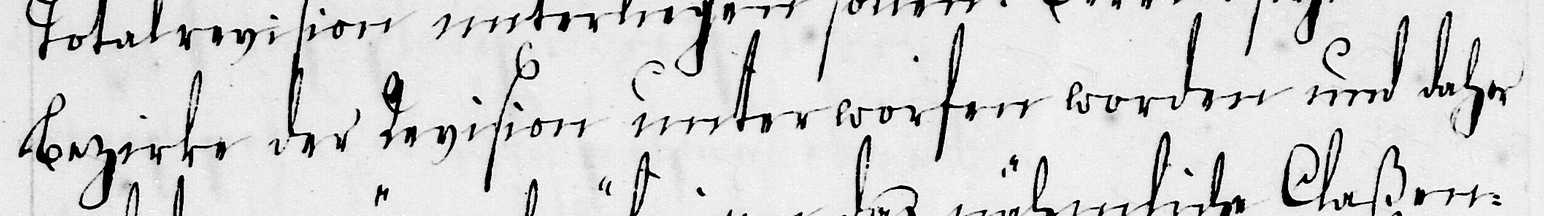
Bezirke der Revision unterworfen worden und daher
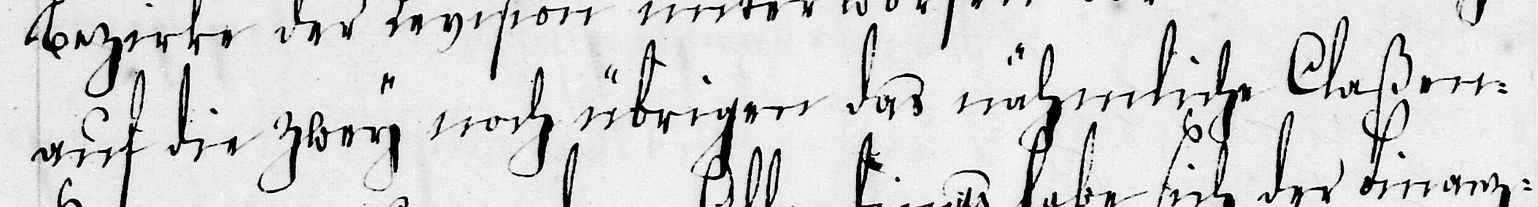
auf die zwey noch übrigen das nähmliche Claßen¬
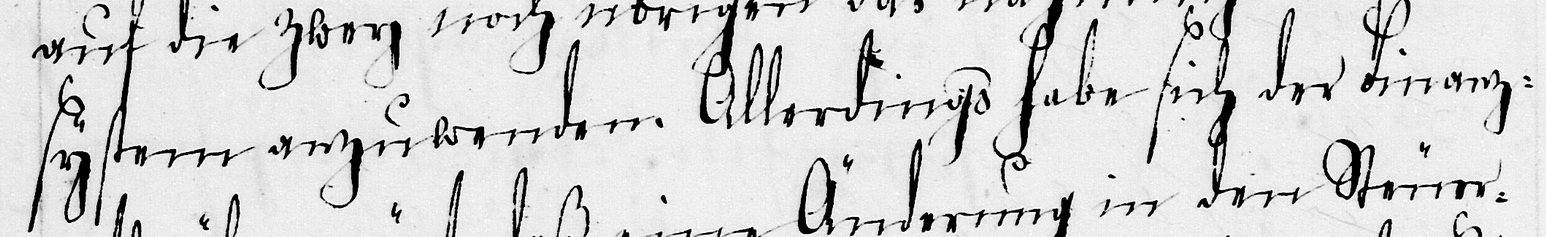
system anzuwenden. Allerdings habe sich der Finanz¬
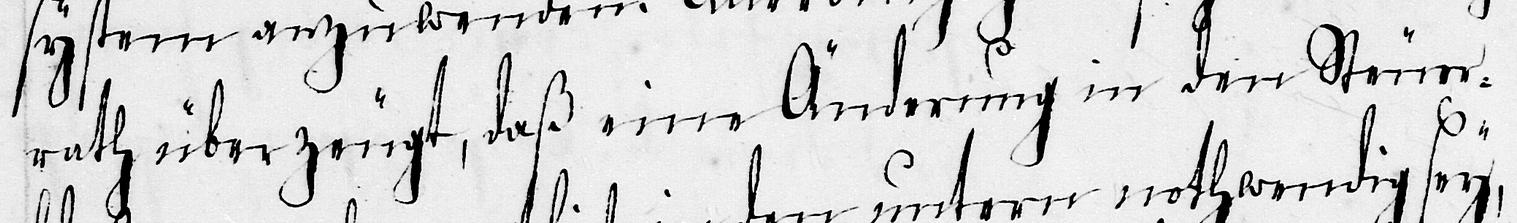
rath überzeugt, daß eine Änderung in den Steuer¬
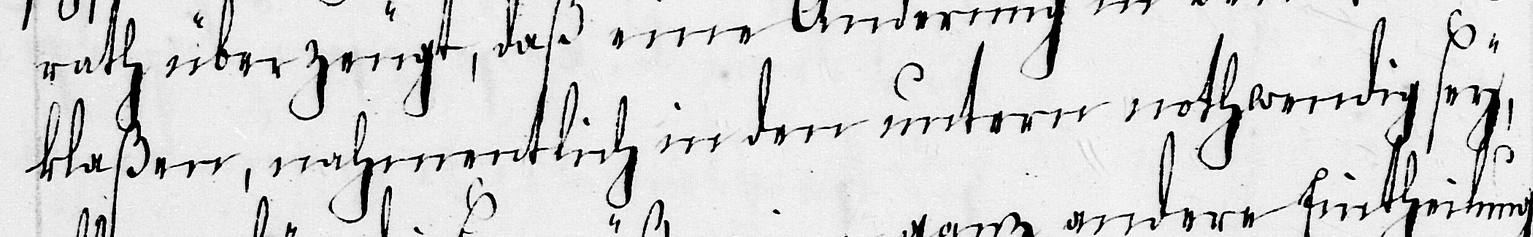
klaßen, nahmentlich in den untern nothwendig sey,
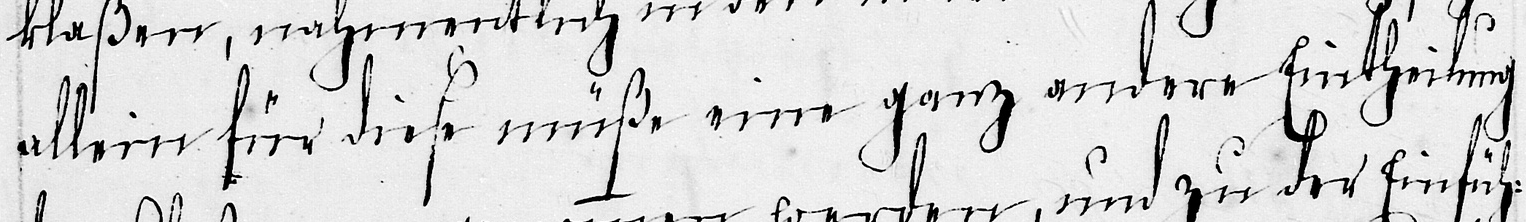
allein für diese müße eine ganz andere Eintheilung
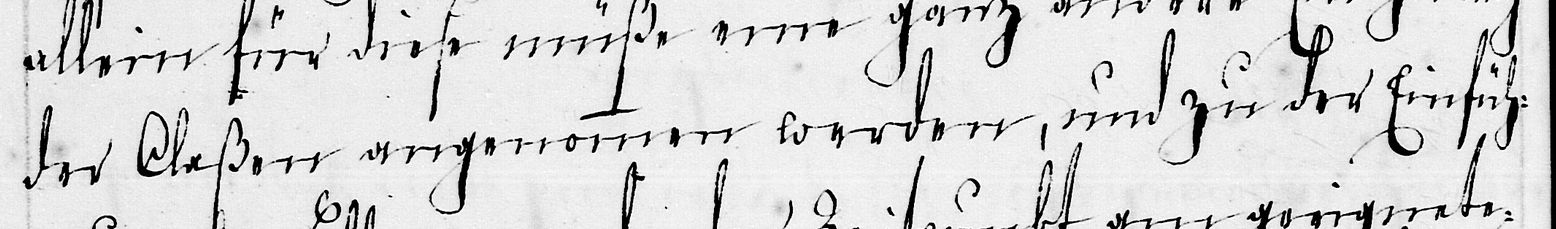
der Claßen angenommen werden, und zu der Einfüh¬
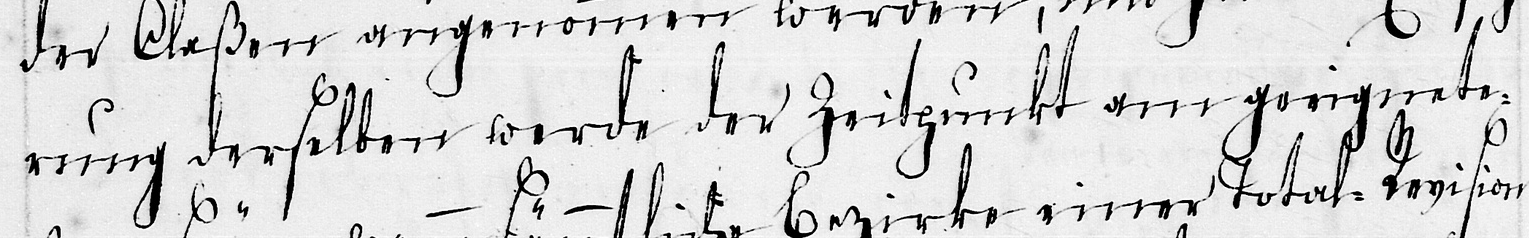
rung derselben wird der Zeitpunkt am geeignet¬
